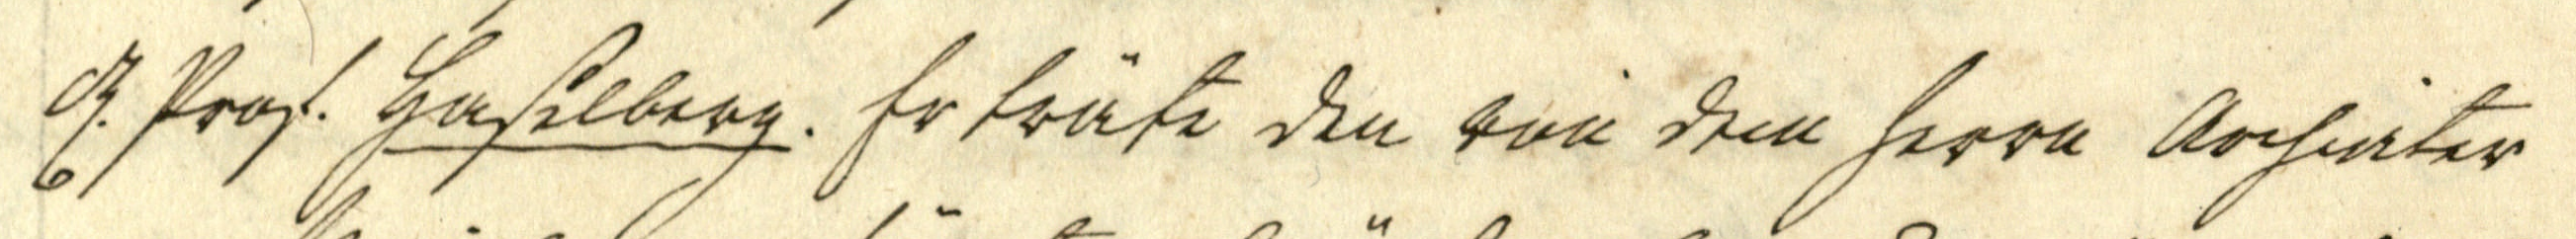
dh. Prof. Haselberg. Er träte den von dem herrn Archiater
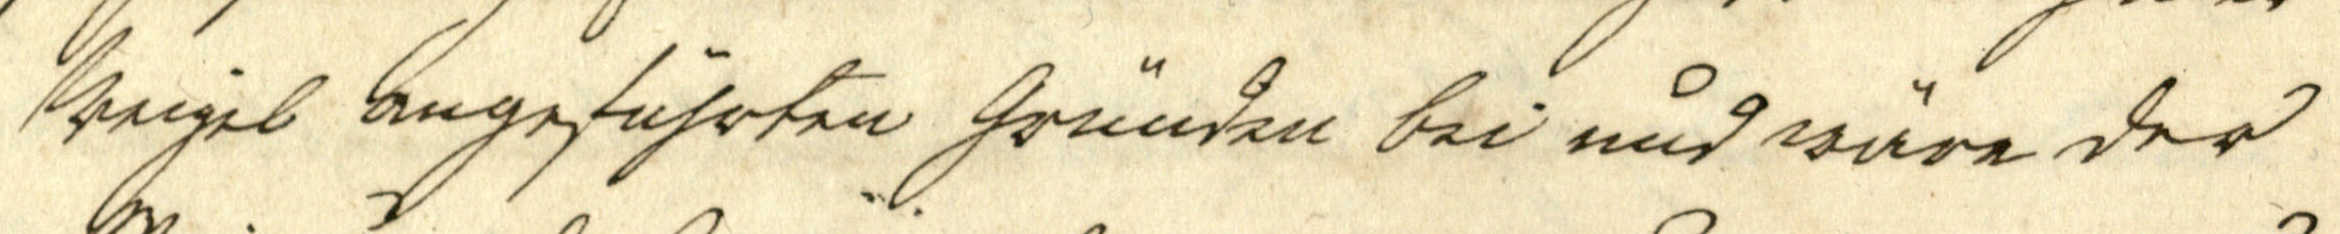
Weigel angeführten Gründen bei und wäre der
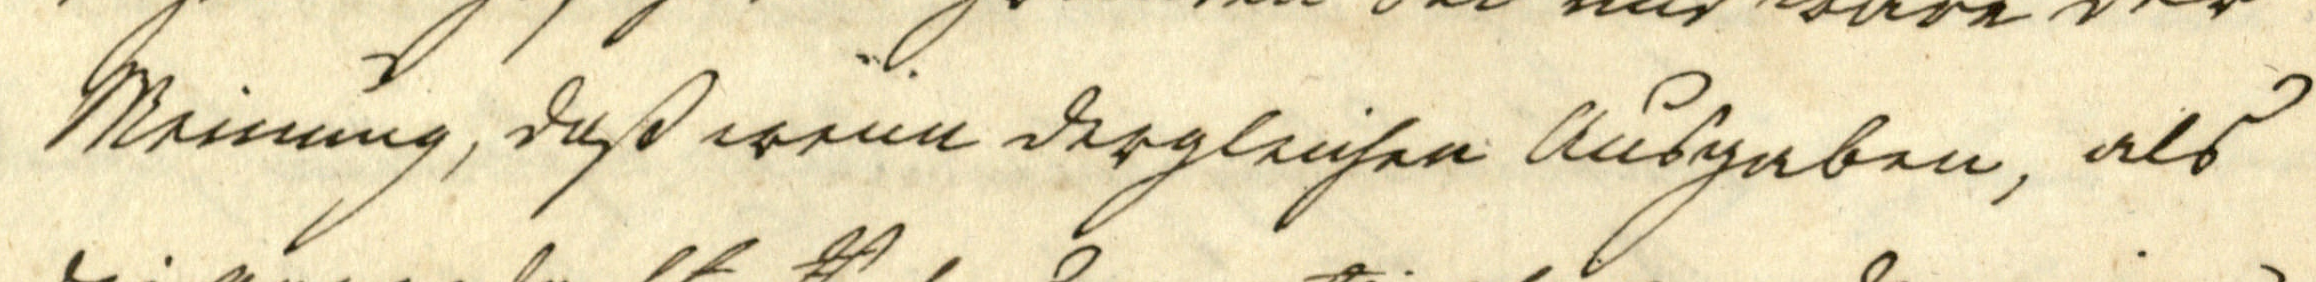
Meinung, daß wenn dergleichen Ausgaben, als
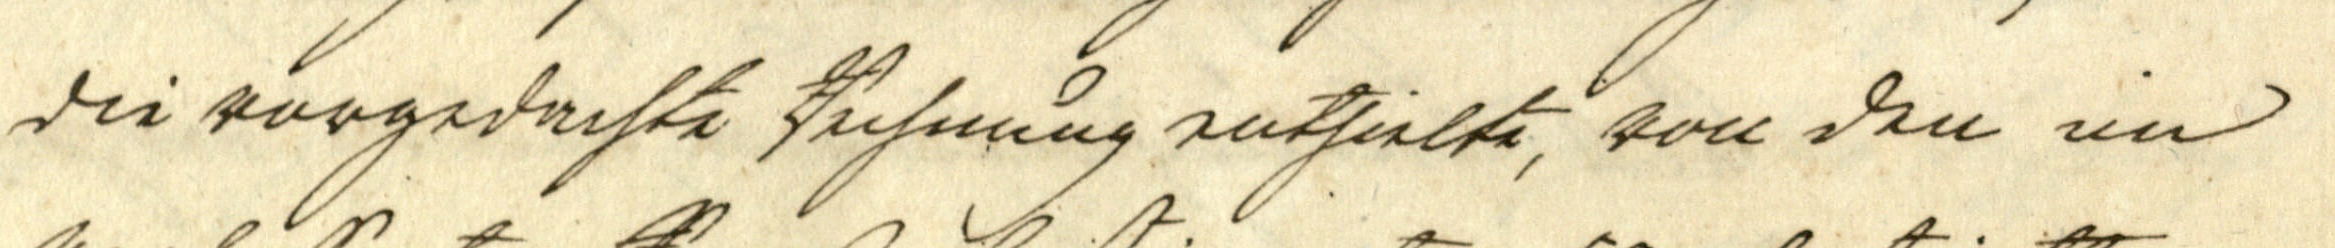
die vorgedachte Rechnung enthielte, von den im
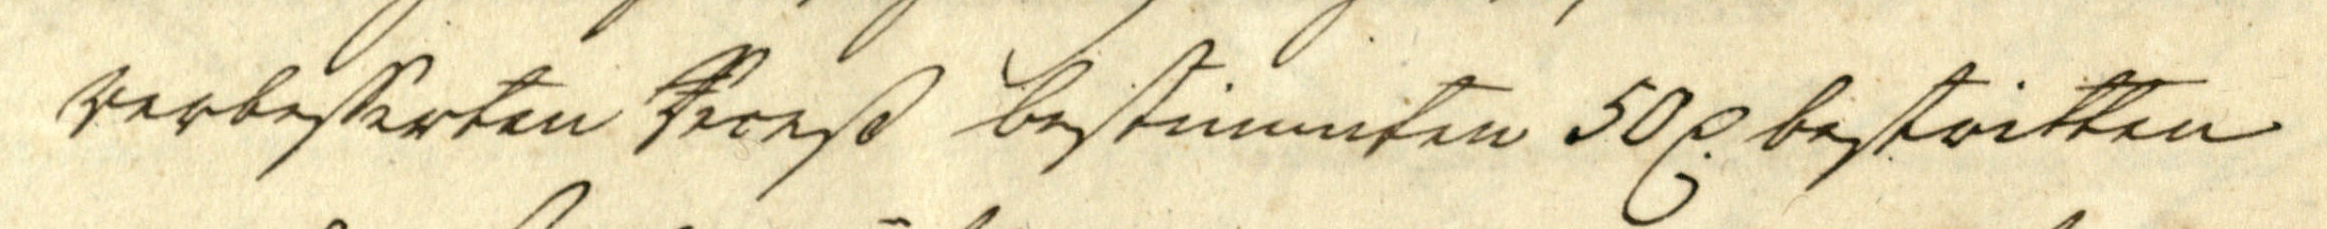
verbesserten Receß bestimmten 50 l. bestritten
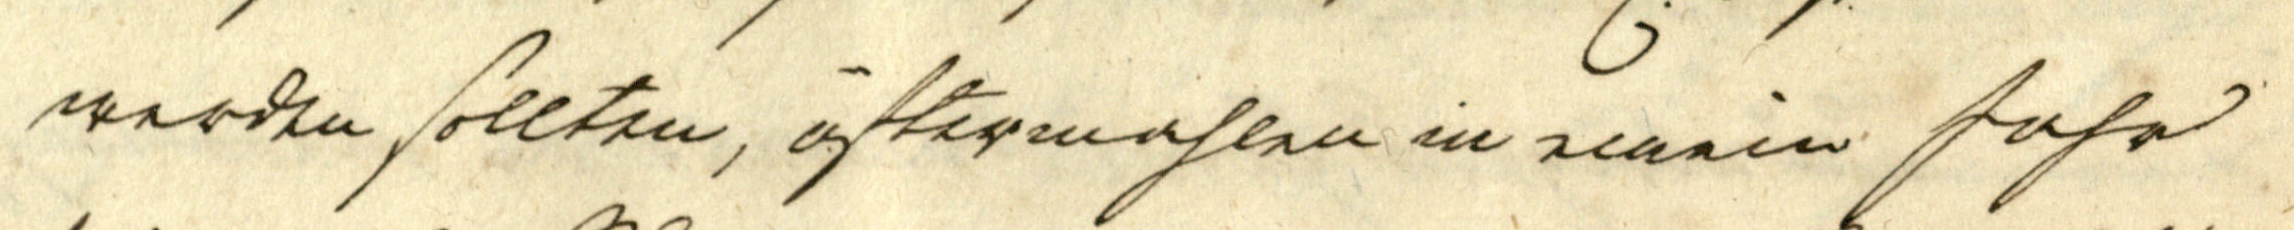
werden sollten, öftermahlen in einem Jahr
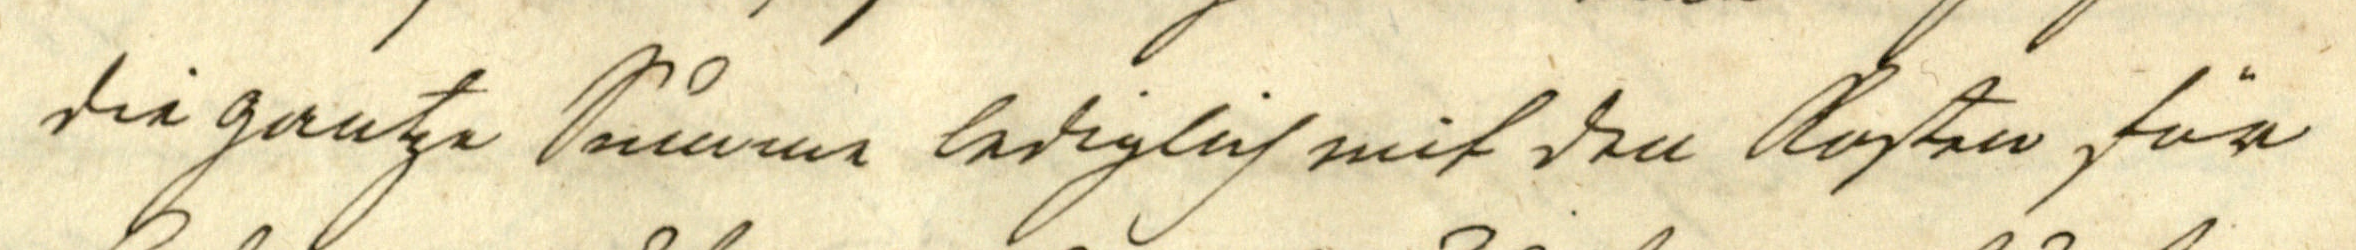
die gantze Summe lediglich mit den Kosten für
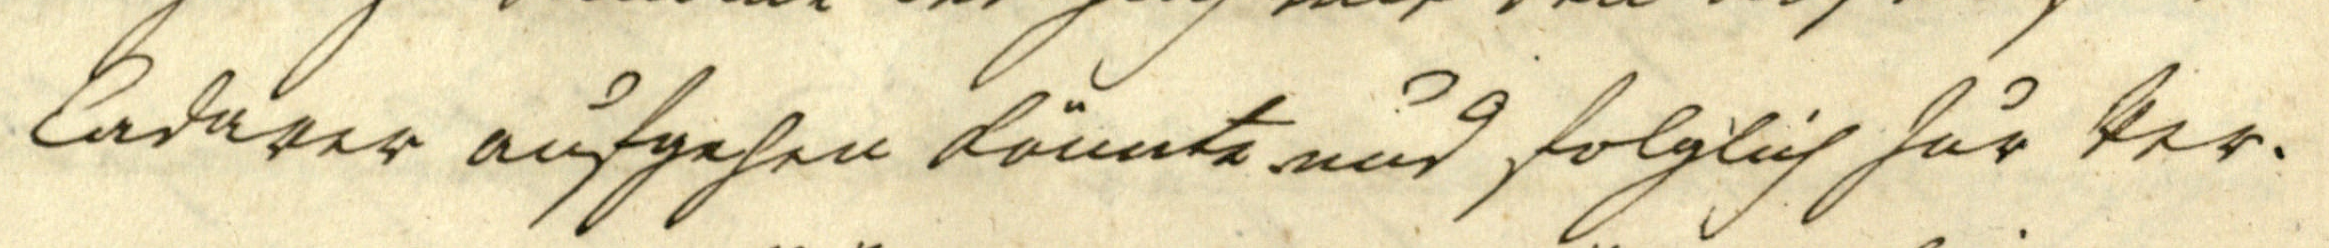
Cadaver aufgehen könnte und folglich zur Ver¬
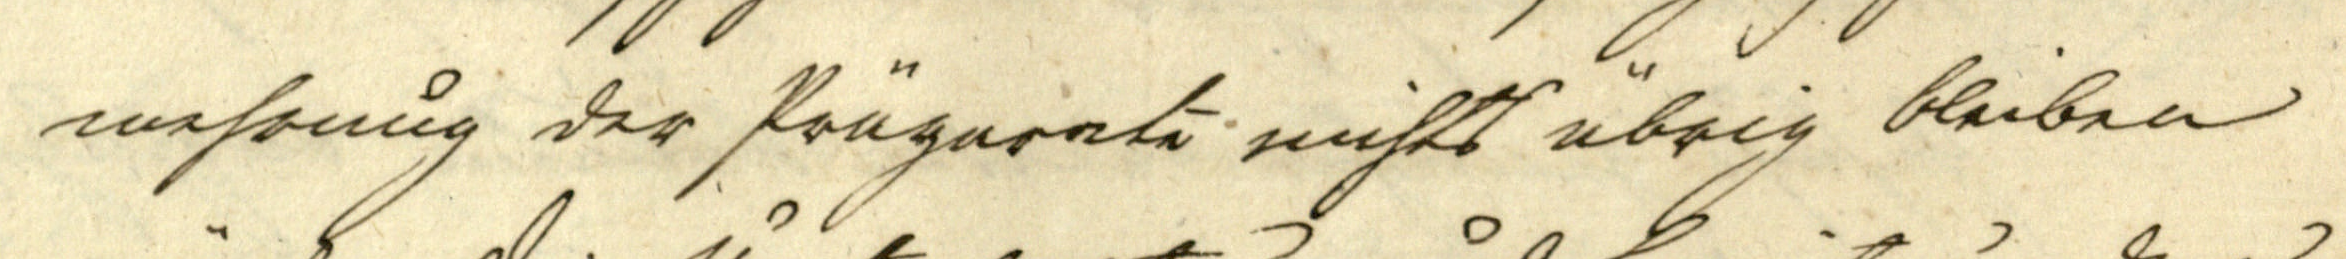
mehrung der Präparate nichts übrig bleiben
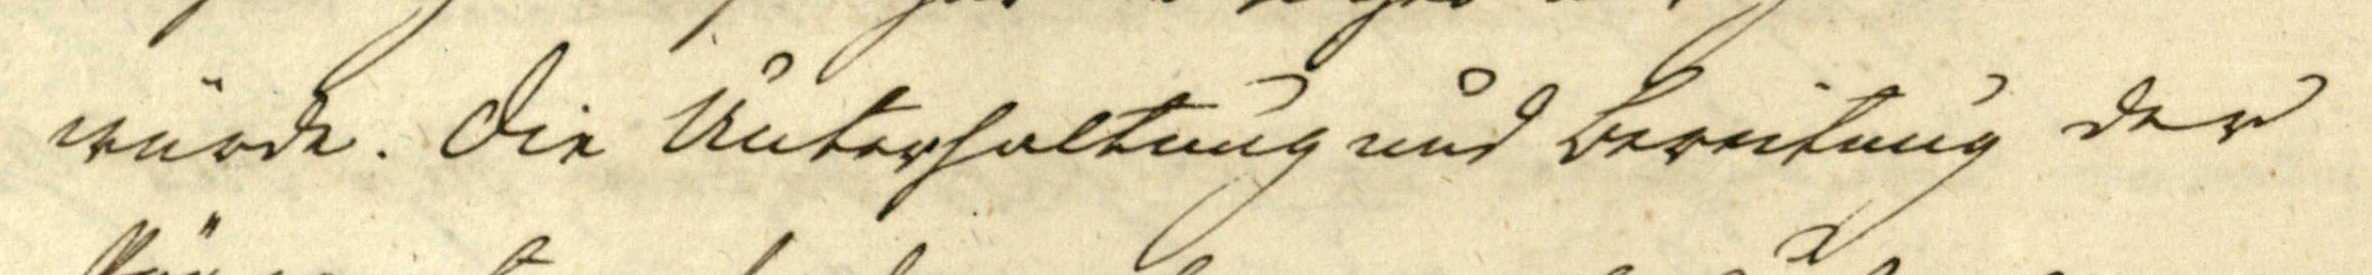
würde. Die Unterhaltung und Bereitung der
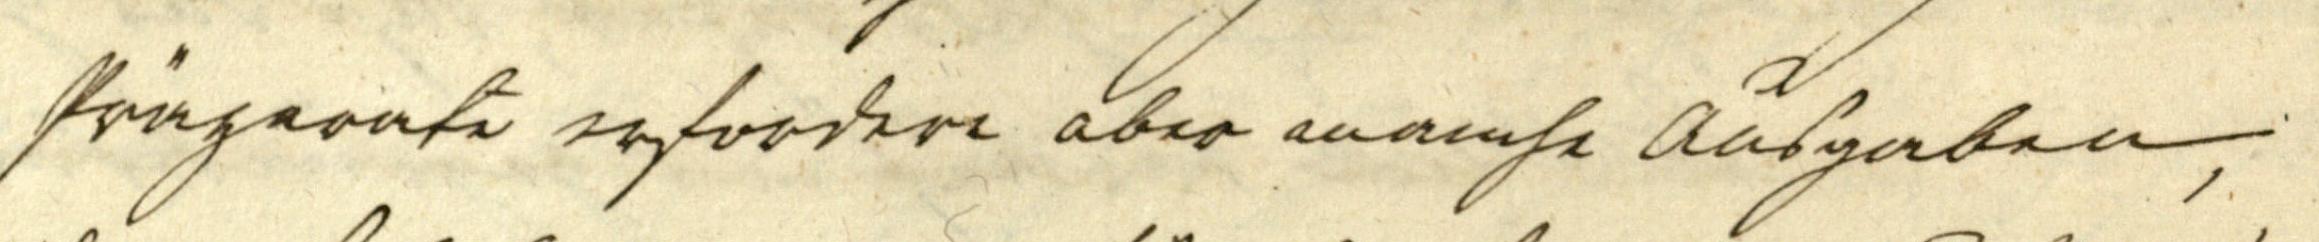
Präparate erfordere aber manche Ausgaben,
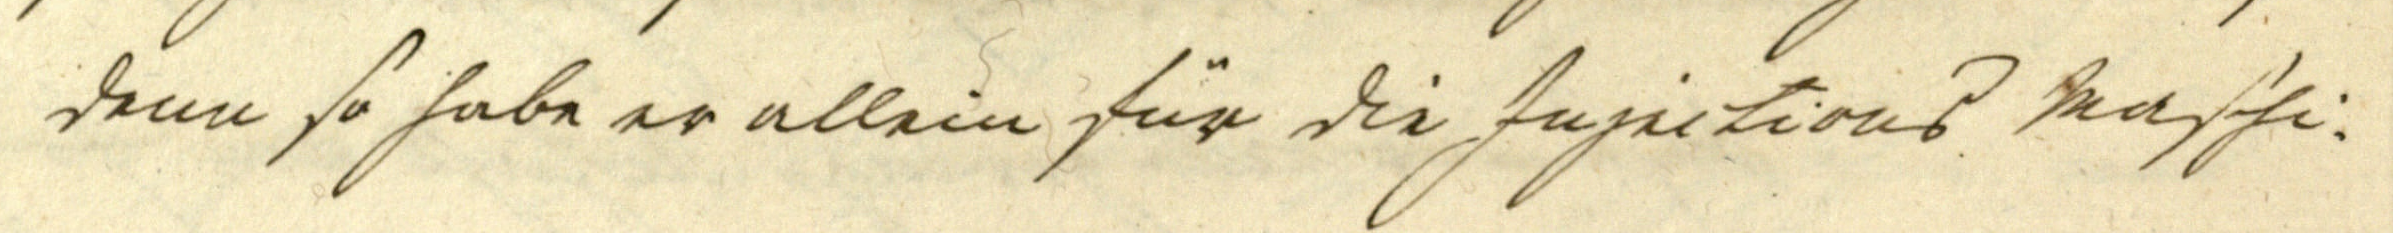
denn so habe er allein für die Injections Maschi¬
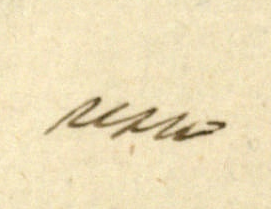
ne
